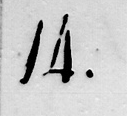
24.
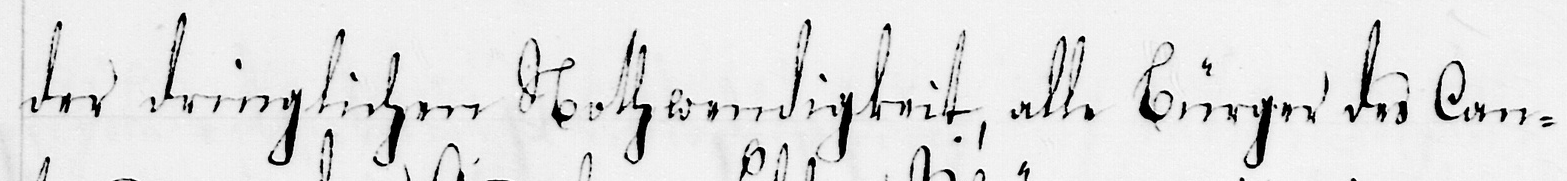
der dringlichen Nothwendigkeit, alle Bürger des Can¬
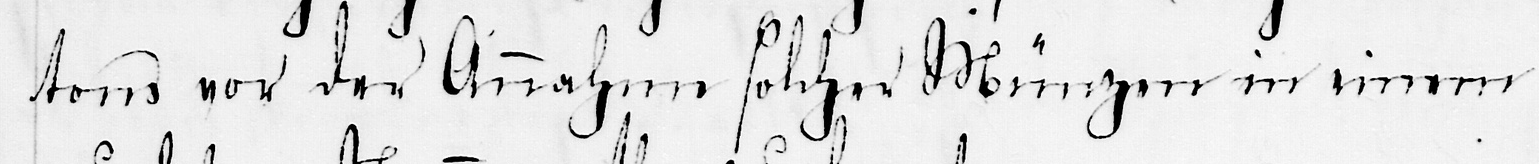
tons vor der Annahme solcher Münzen in einem
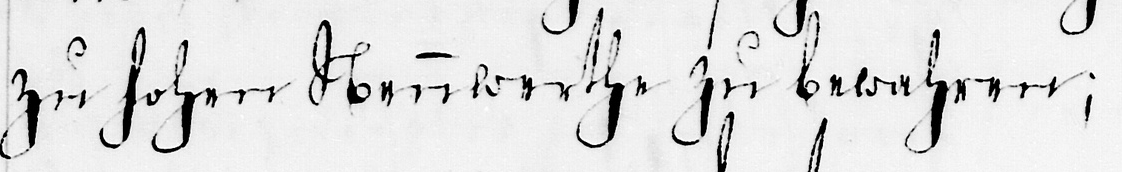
zu hohen Nennwerthe zu bewahren;
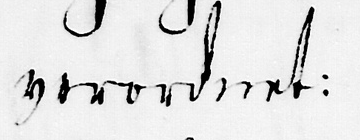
verordnet:
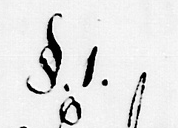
§. 1.
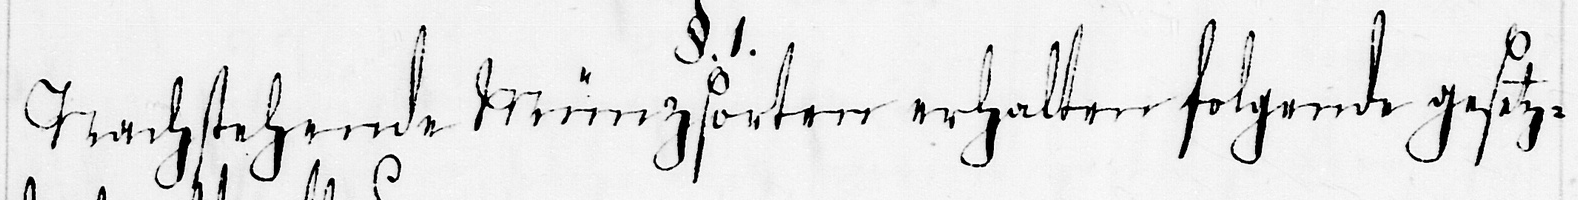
Nachstehende Münzsorten erhalten folgende gesetz¬
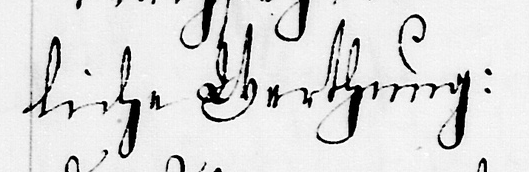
liche Werthung:
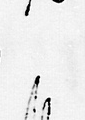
40.
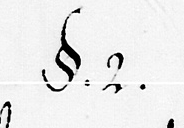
§. 2.
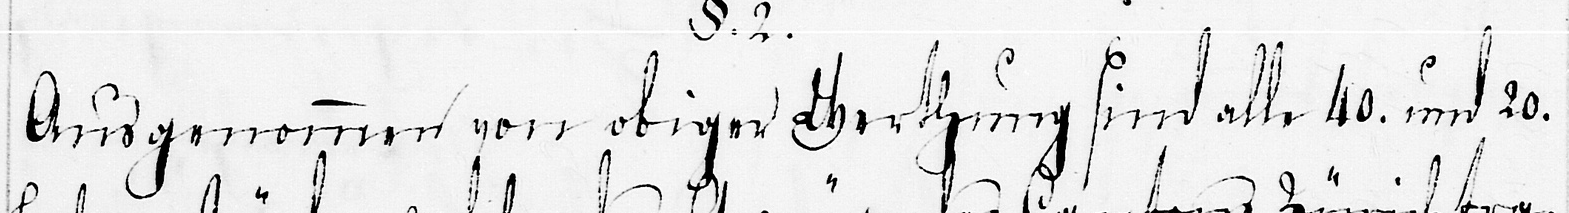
Ausgenommen von obiger Werthung sind alle 40. und 20.
